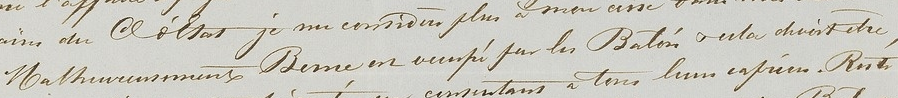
Malheureusement Berne est occupé par les Bâlois et cela devait être,
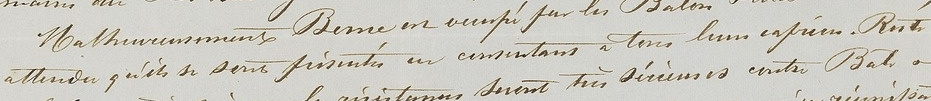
attendu qu'ils se sont présentés en consentant à tous leurs caprices. Reste
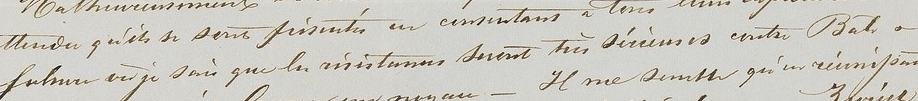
Soleure où je sais que les résistances seront très sérieuses contre Bâle &
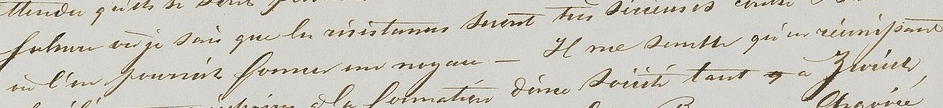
où l'on pouvait former un noyau. Il me semble qu'en réunissant
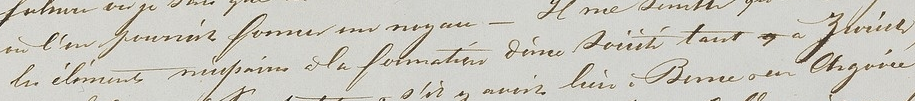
les éléments necéssaires à la formation d'une Société tant n à Zurich,
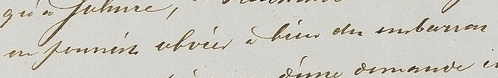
on pourrait obvier à bien du embarras.
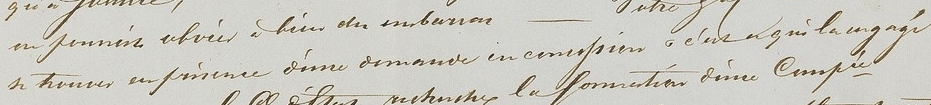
se trouver en présence d'une demande en concession & c'est ce qui la engagé
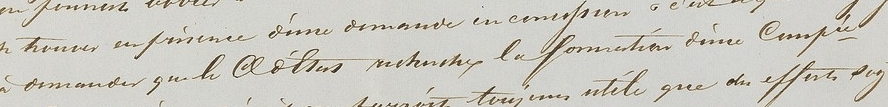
demander que le Cl d'Etat recherchera la formation d'une Compie.
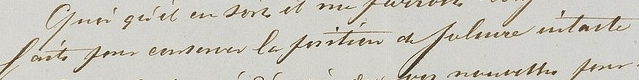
faits pour conserver la position de Soleure intacte.
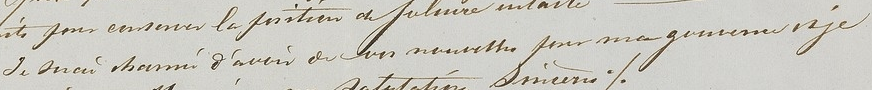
Je serai charmé d'avoir de vos nouvelles pour me gouverner et je
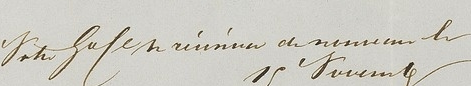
Notre Gr Cl se réunira de nouveau le
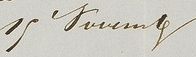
19 Novemb
